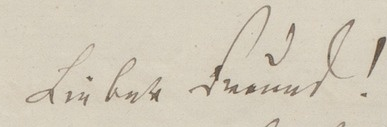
Lieber Freund!
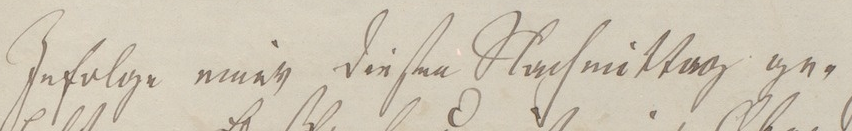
Infolge einer diesen Nachmittag ge-
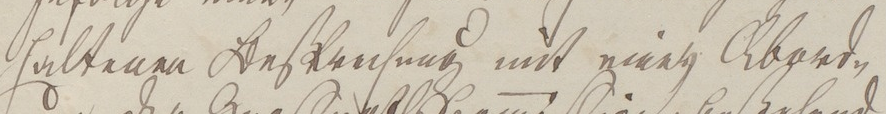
haltenen Besprechung mit einer Abord-
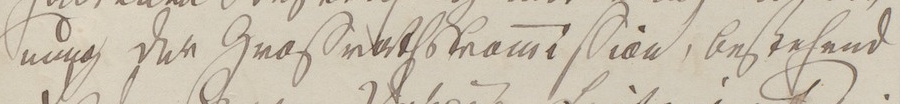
nung der Grossrathskommission, bestehend
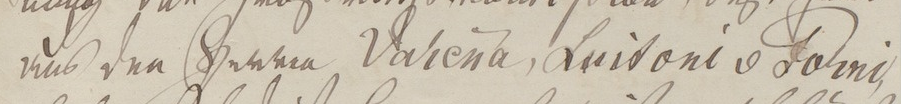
aus den Herren Varenna, Luisoni & Forni
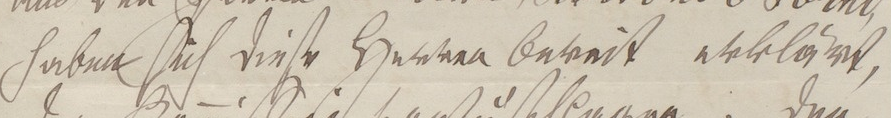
haben sich diese Herren bereit erklärt,
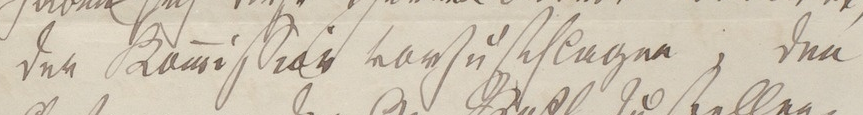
der Kommission vorzuschlagen, den
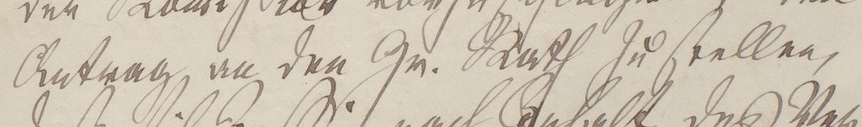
Antrag an den Gr. Rath zu stellen,
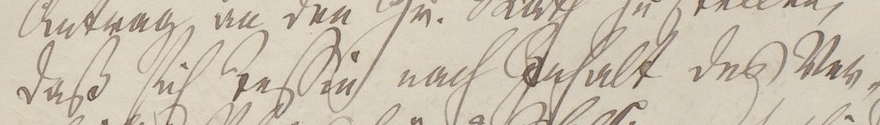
daß sich Tessin nach Ihhalt des Ver-
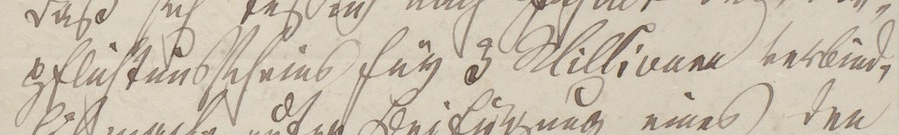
pflichtunsscheins für 3 Millionen verbind-
